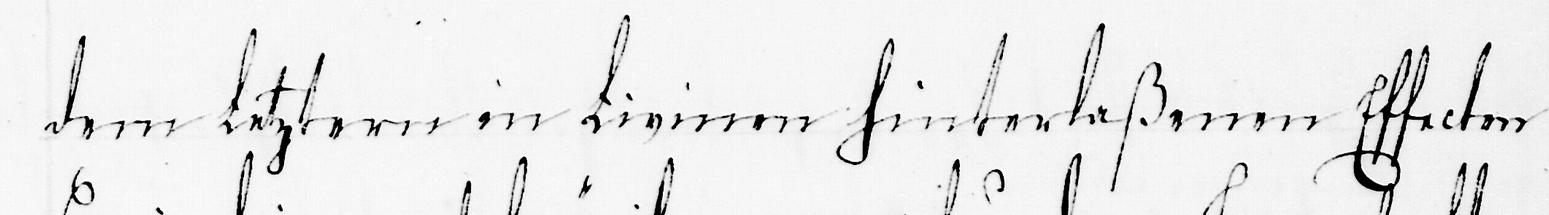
dem Letztern in Livinen hinterlaßenen Effecten
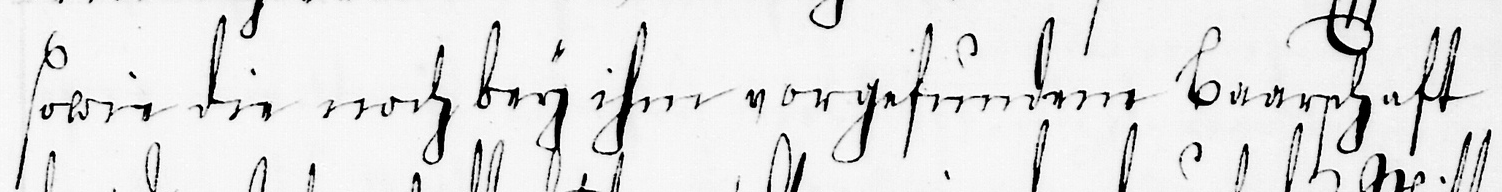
sowie die noch bey ihm vorgefundene Baarschaft
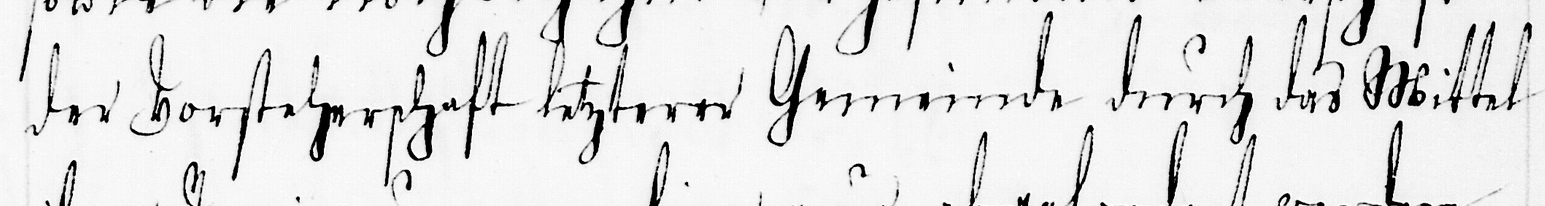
der Vorsteherschaft letzterer Gemeinde durch das Mittel
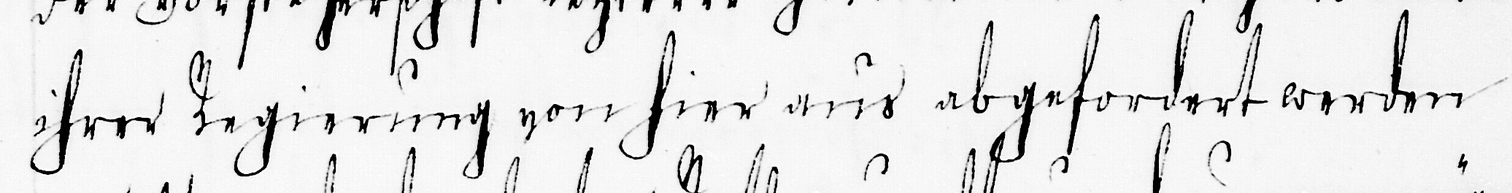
ihre Regierung von hier aus abgefordert werden
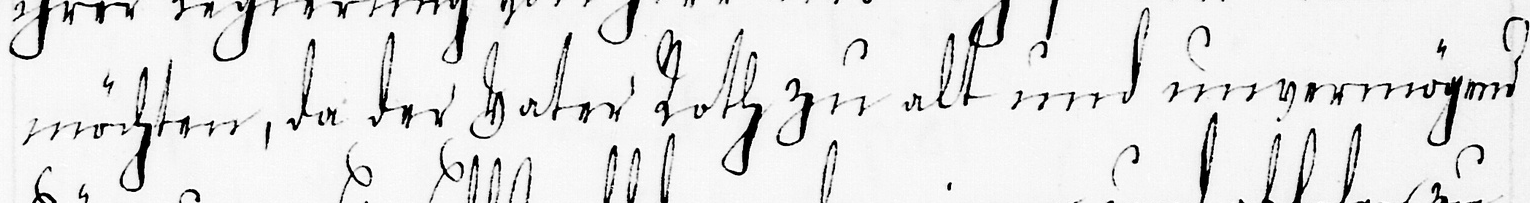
möchten, da der Vater Roth zu alt und unvermögend
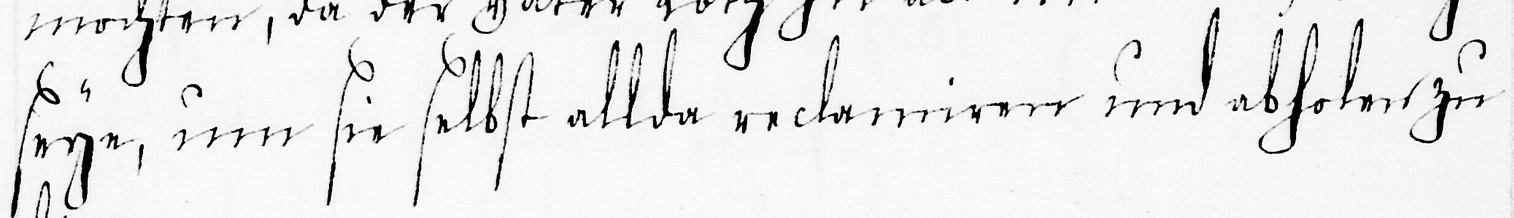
seye, um sie selbst allda reclamiren und abholen zu
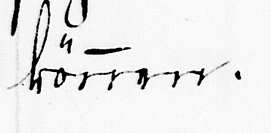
können.
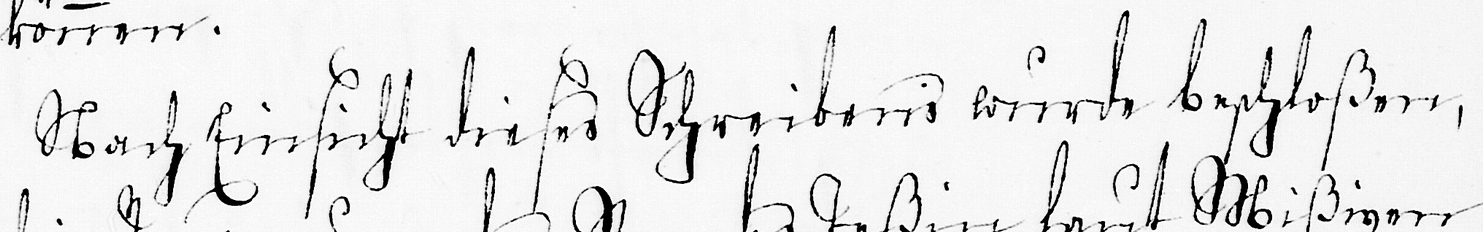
Nach Einsicht dieses Schreibens wurde beschloßen,
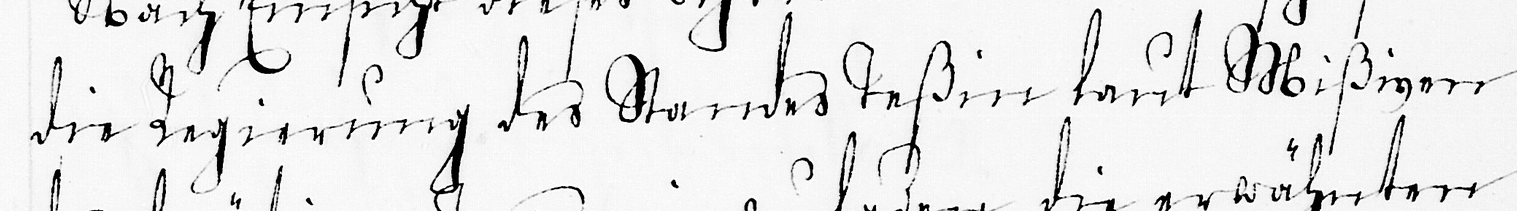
die Regierung des Standes Teßin laut Mißiven
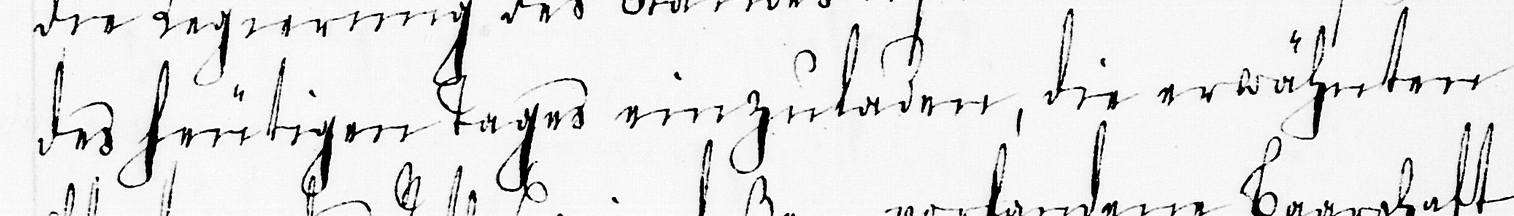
des heutigen Tages einzuladen, die erwähnten
